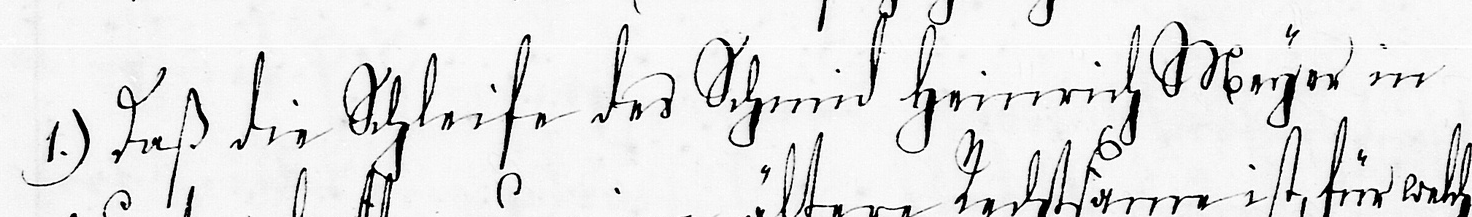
1.) Daß die Schleife des Schmid Heinrich Meyer in
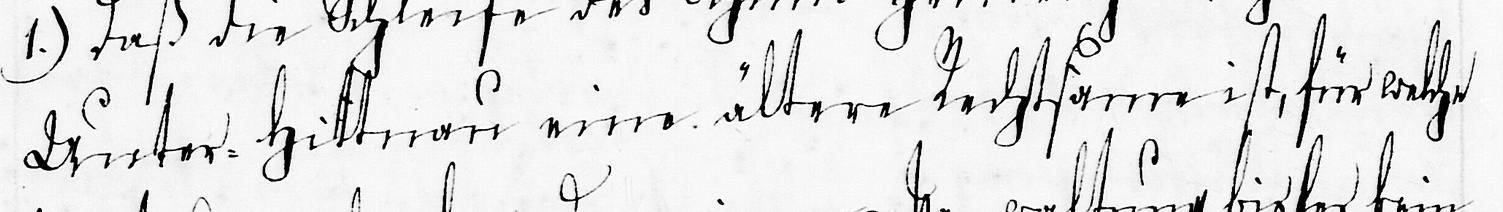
Unter-Hittnau eine ältere Rechtsame ist, für welc¬
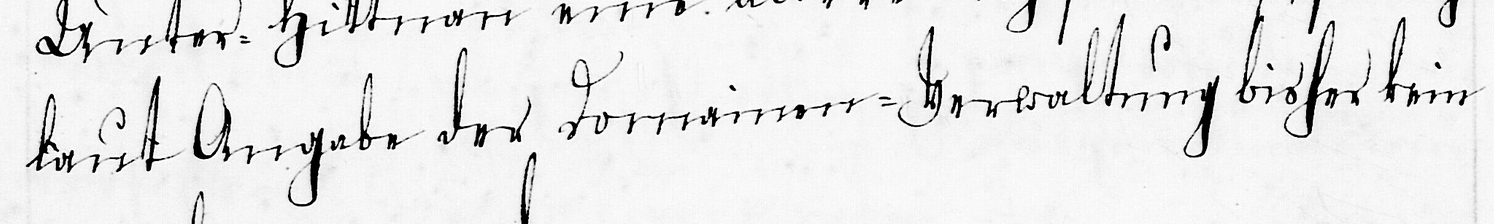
laut Angabe der Domainen-Verwaltung bisher kein
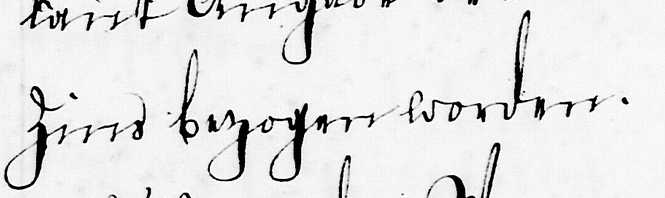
Zins bezogen worden.
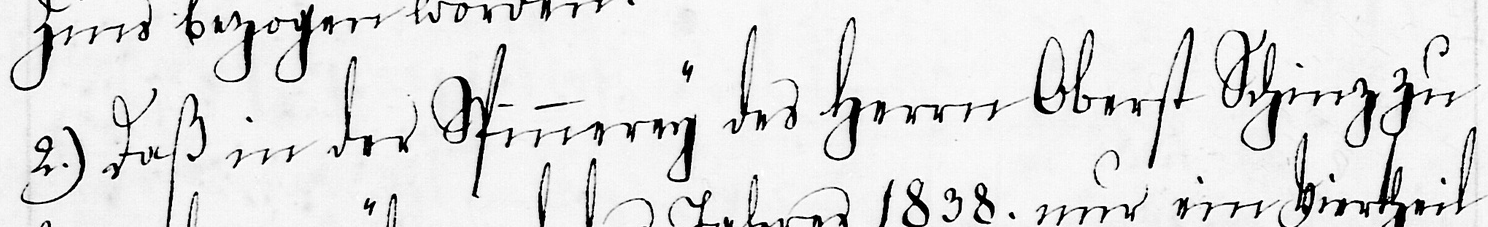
2.) Daß in der Spinnerey des Herrn Oberst Schinz zu
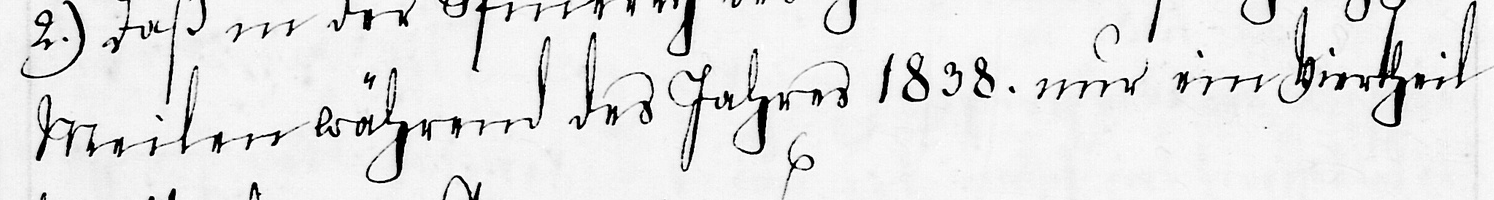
Meilen während des Jahres 1838. nur ein Viertheil
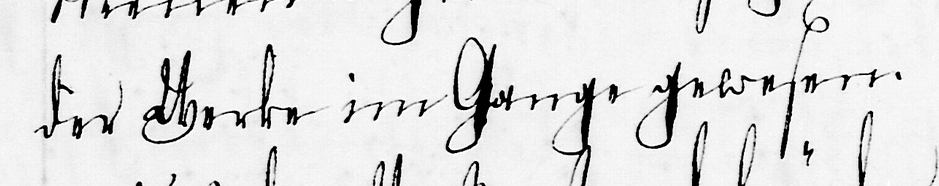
der Werke im Gange gewesen.
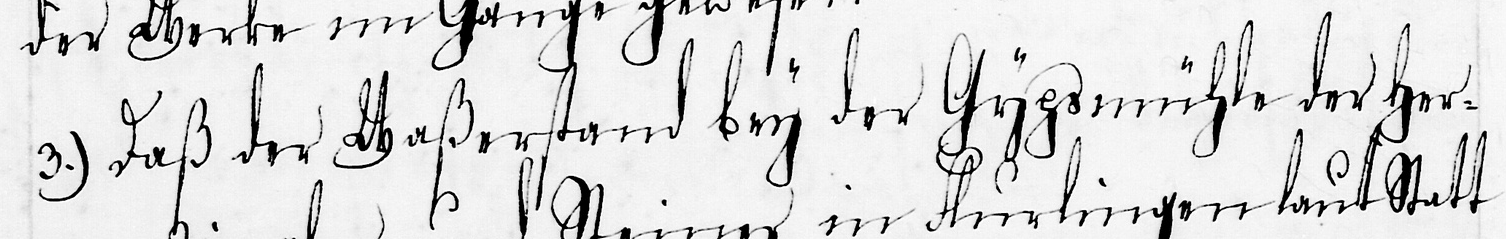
3.) Daß der Waßerstand bey der Gypsmühle der Her¬
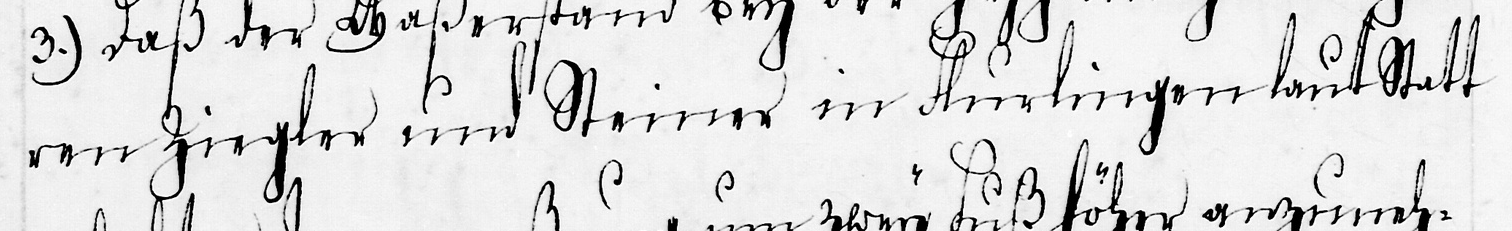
ren Ziegler und Steiner in Flurlingen laut Statt
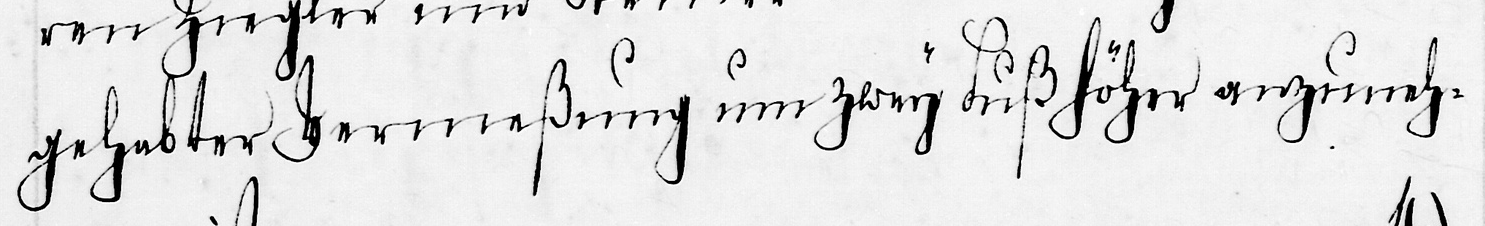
gehabter Vermeßung um zwey Fuß höher anzuneh¬
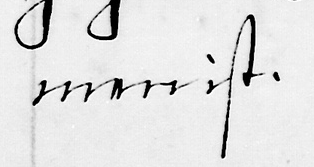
men ist.
